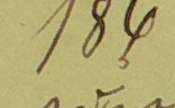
184
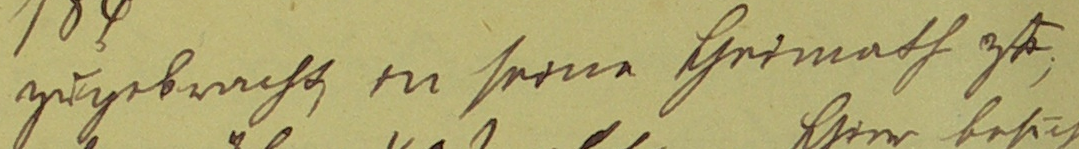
zugebracht, in seine Heimat zurück
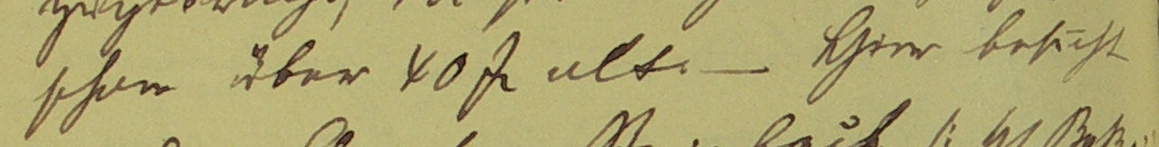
schon über 40 Jahre alt—Hier besucht
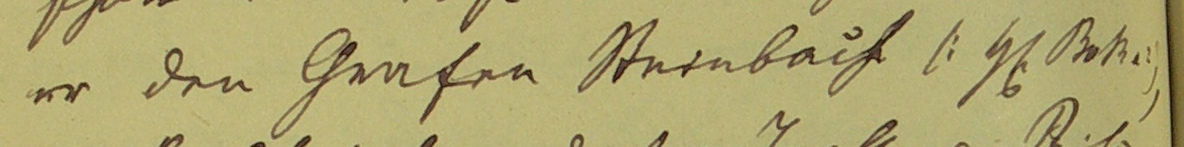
er den Grafen Steinbach ( : H. Bako : )
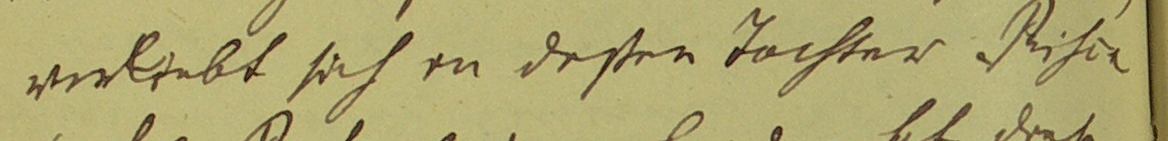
verliebt sich in deßen Tochter Riha
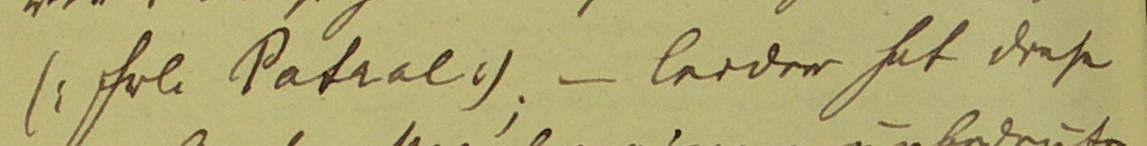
( : Frl. Patrali : ) --leider hat diese
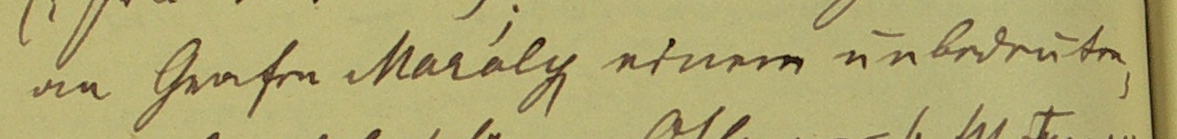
am Grafen Maraly, einen unbedeuteten ,
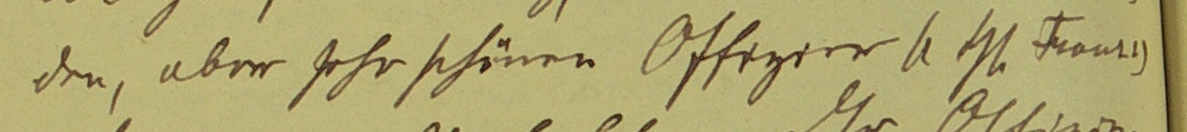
aber sehr schönen Offizier ( : H. Franz : )
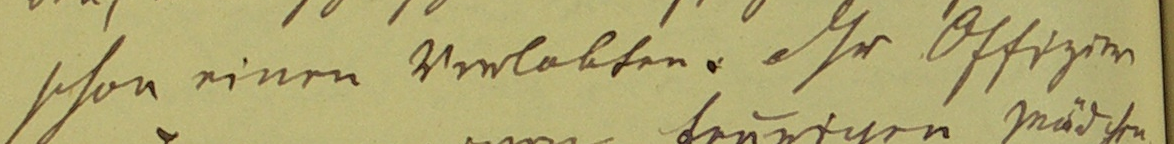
schon einen Verlobten. Dieser Offizier
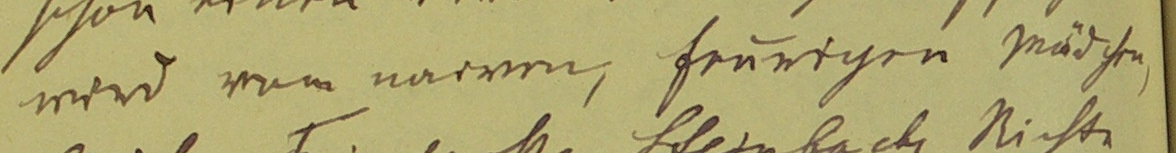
wird vom naivem, feurigen Mädchen
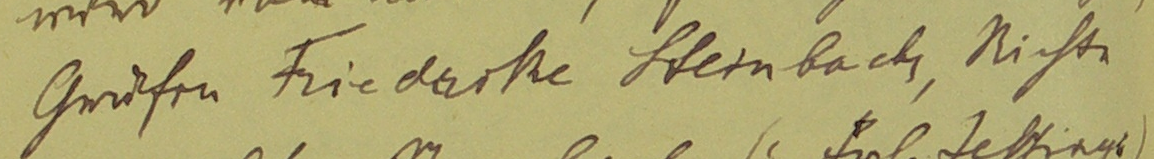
Gräfin Friedericke Steinbach , Nichte
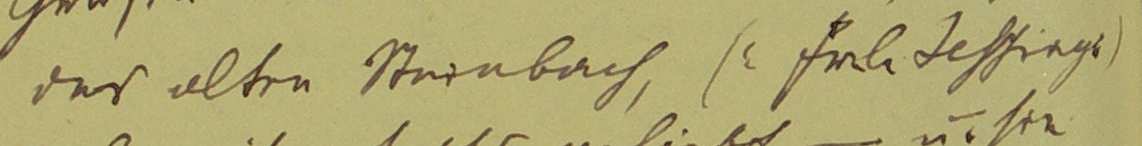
des alten Steinbach ( : Frl. Lessinger : )
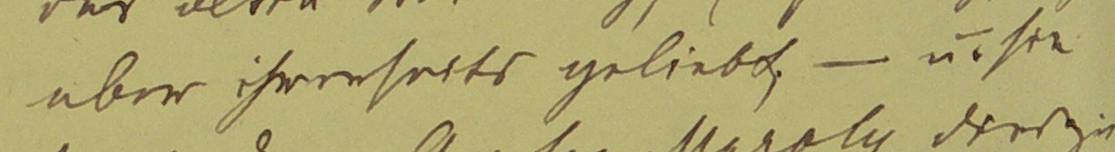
aber ihrerseits geliebt,- -und sie
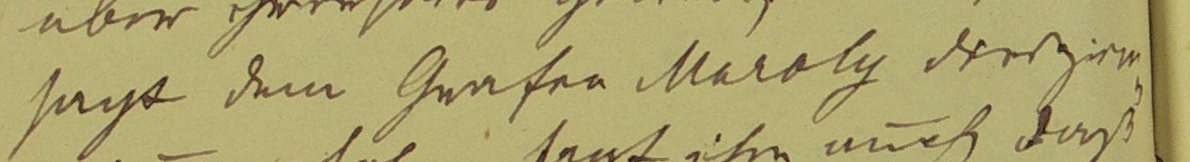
sagt dem Grafen Maroly dies
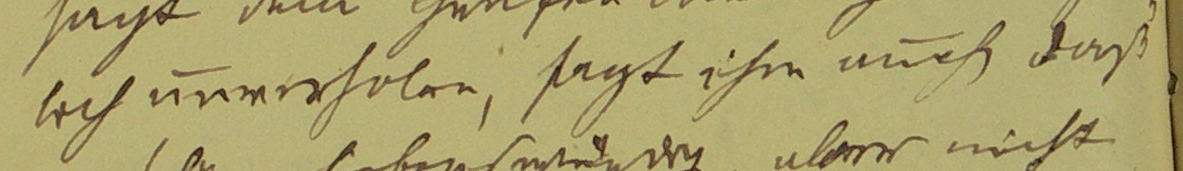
unverholen, sagt ihm auch das
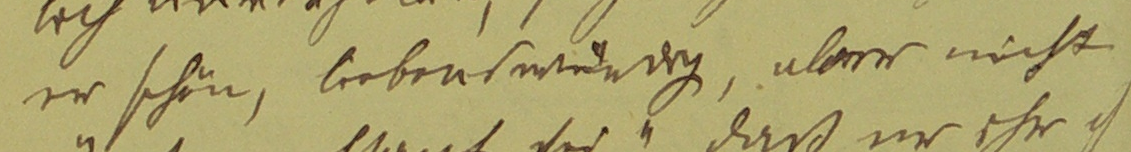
er schön und liebeswürdig, aber nicht
